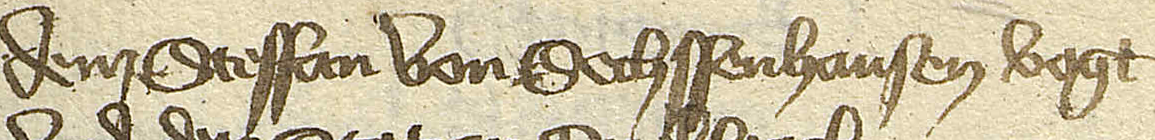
dem Steffan von Sechſſenhauſen vogt
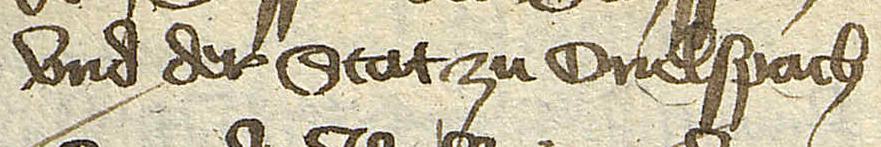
vnd der Stat cʒu Onelſpach
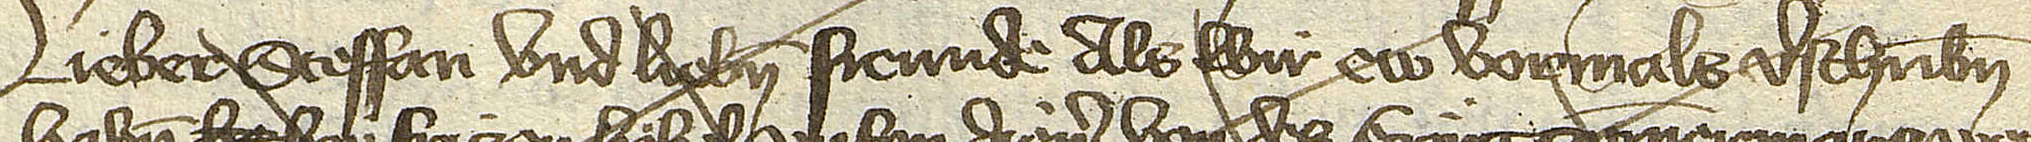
Lieber Steffan vnd liebn* freunde Als wir ew vormals v*ſchribn*
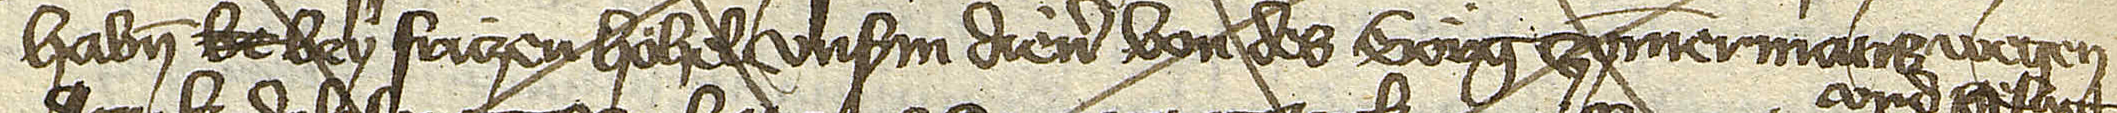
habn* be bey fricʒen höhel vnſ*m dien* von des Görg cʒym*ermans wegen
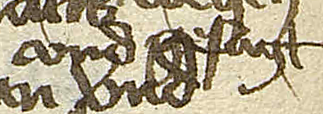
vnd geſagt
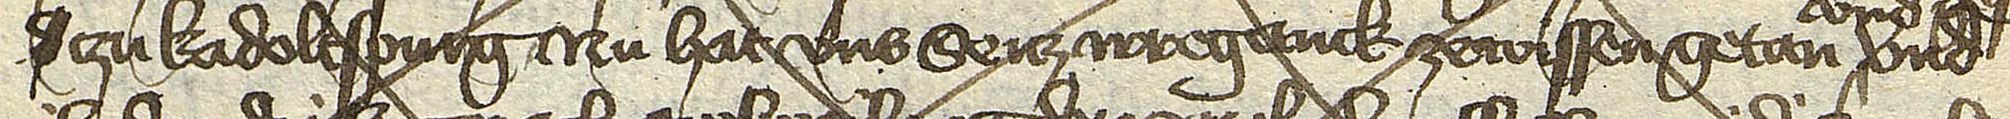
d cʒu kadoltſpurg Nu hat vns Seicʒ irreganck cʒewiſſen getan vnd
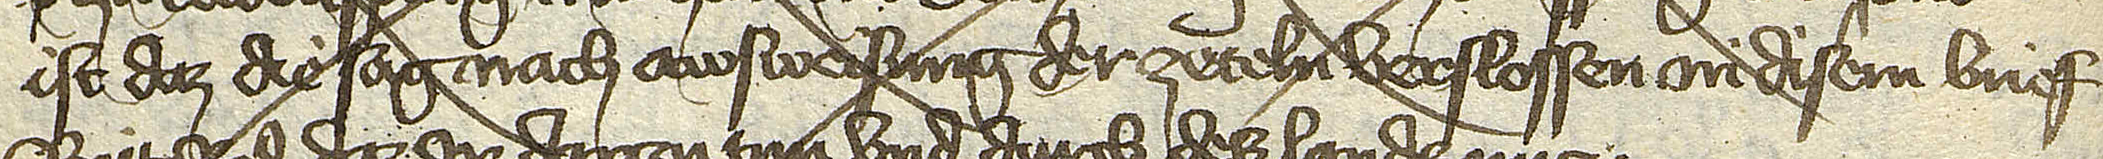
iſt daʒ die ſag nach awſweiſʒung der cʒeteln verſloſſen in diſem brief
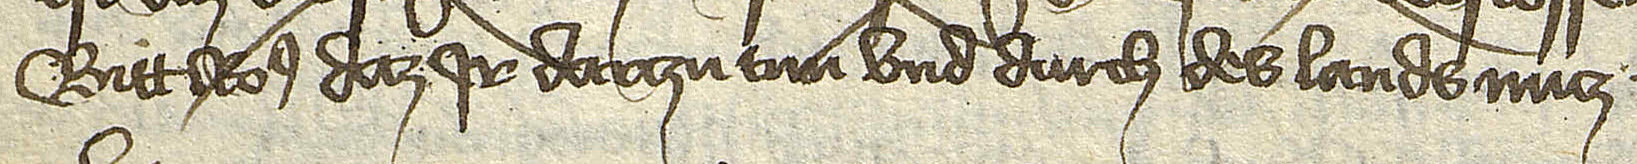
Bitt Ro* daʒ Ir darcʒu tun vnd durch des lands nucʒ
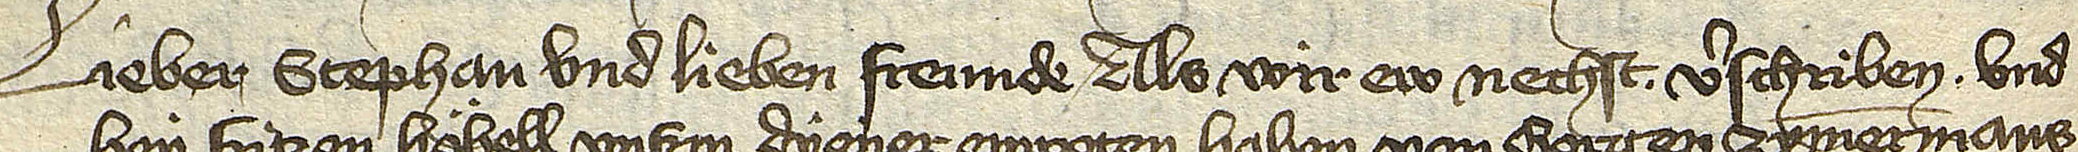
Lieber Stephan vnd lieben freunde / Als wir ew nechſt . v*ſchriben . vnd
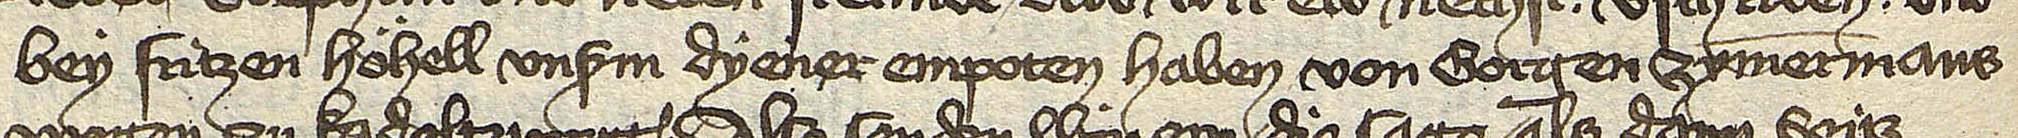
bey fricʒen höhell vnſ*m dyener empoten haben von Gorgen cʒym*ermans
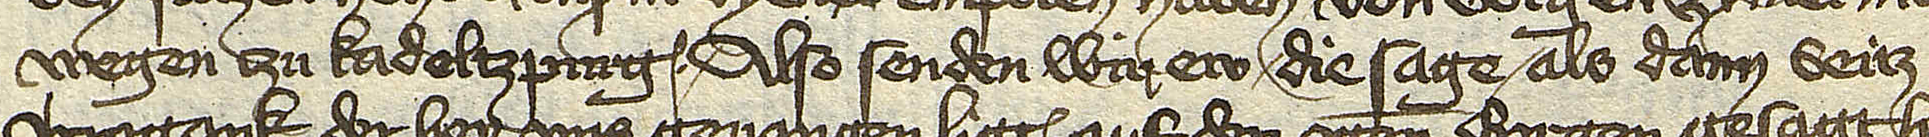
wegen cʒu kadoltʒpurg* . / Alſo ſenden wir ew / die ſage / als dann Seicʒ
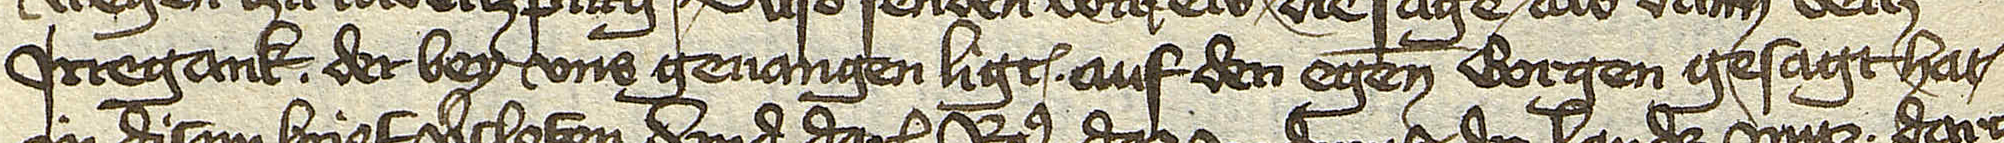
Irregank . der bey vns geuangen ligt* . auf den egen* Gorgen geſagt hat /
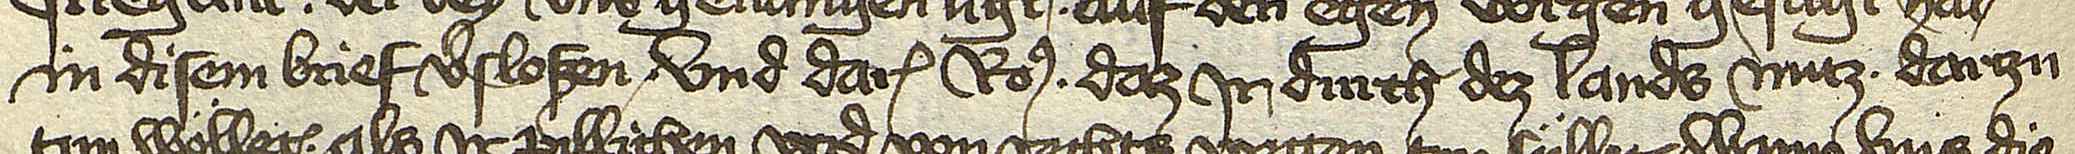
in diſem brief v*ſloſʒen / vnd dar* Ro* . daʒ Ir durch deʒ lands nucʒ darcʒu
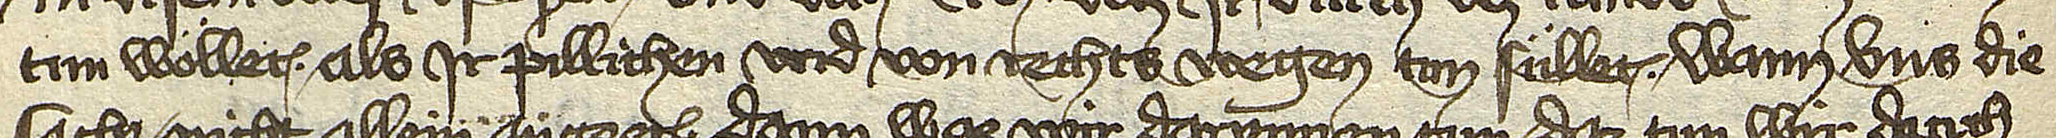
tun wöllet* . / als Ir pillichen vnd von rechts wegen tun ſüllet . / wann vns die
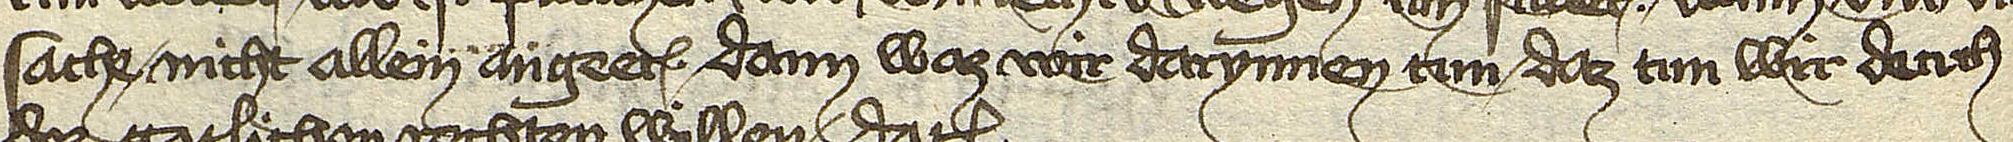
ſache / nicht allein angeet* dann waʒ wir darynnen tun / daʒ tun wir durch
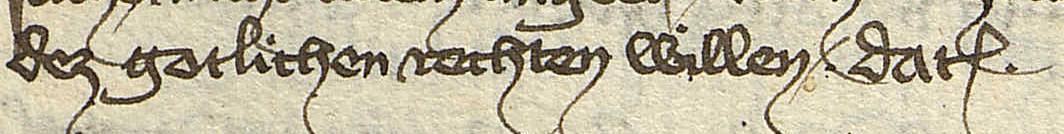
deʒ gotlichen rechten willen / . dat*.
